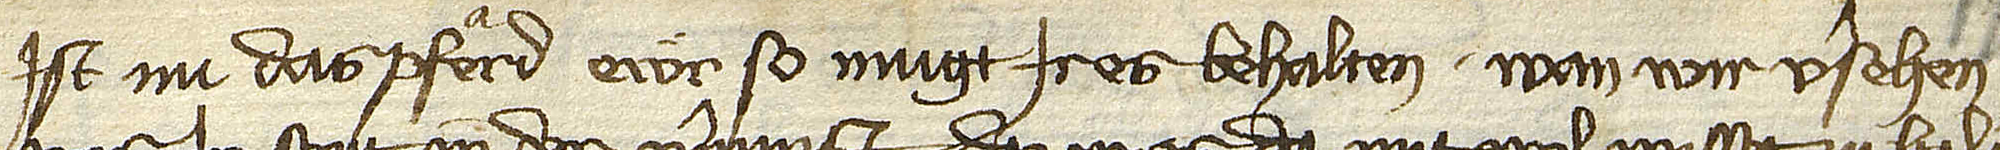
Iſt nu das pfërd ewr ſo mugt Ir es behalten . wan wir v*ſehen
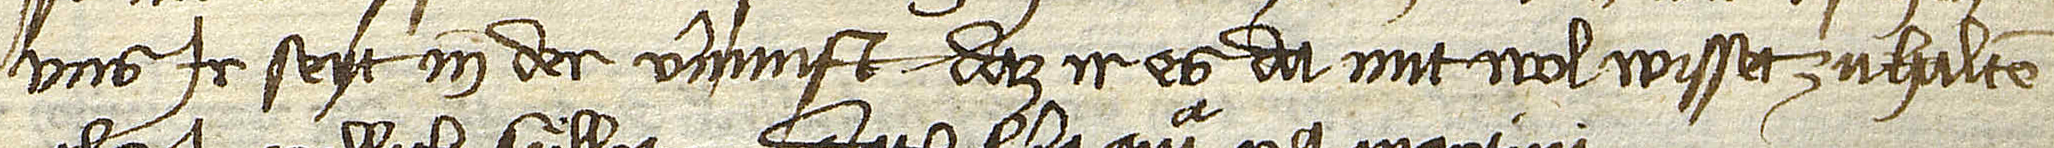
vns Ir ſeyt in der v*nunft daʒ ir es da mit wol wiſſet ʒu halte*
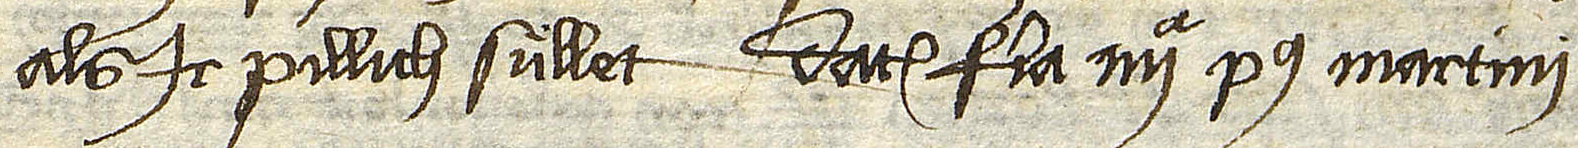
als Ir pillich ſüllet / Dat* fia* iiii* p* martinii
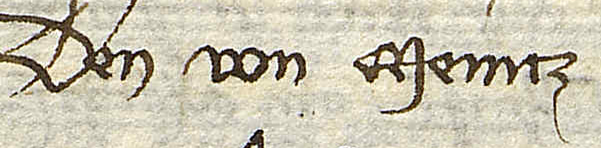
Den von Meincʒ
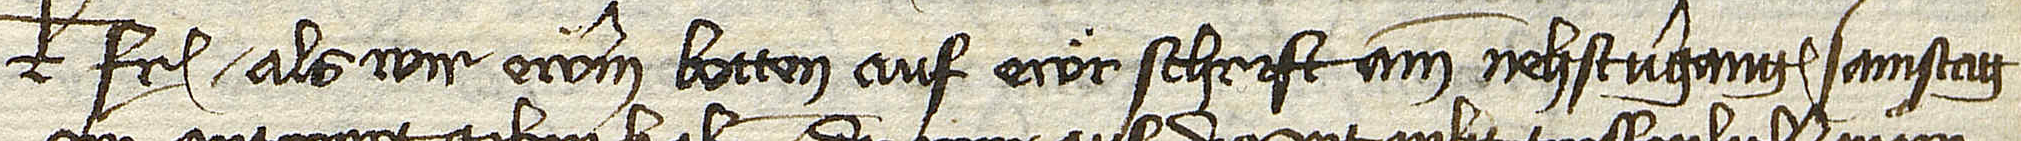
L* fr* / als wir ew*n botten auf ewr ſchrift am* nehſt u*gang* ſamſtag
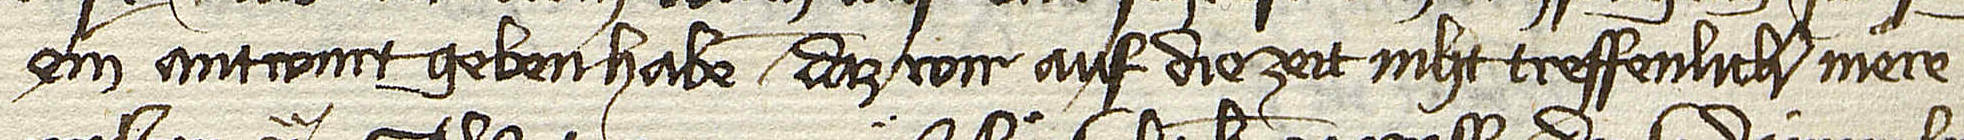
ein antwurt geben habe* / daʒ wir auf die ʒeit niht treffenlich* mëre
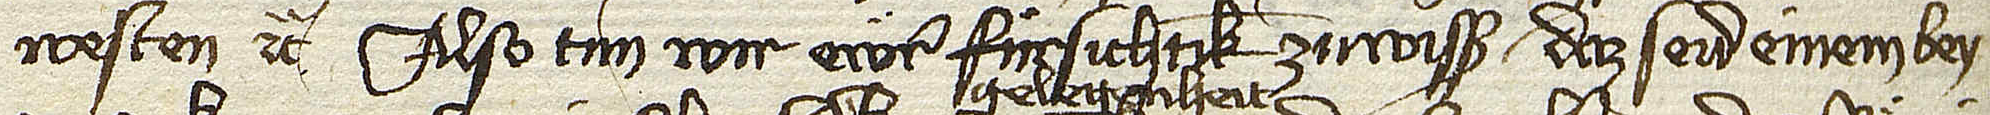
weſten ec* Alſo tun wir ew*r fürſichtik* ʒuwiſſ* / daʒ ſeid einem bey
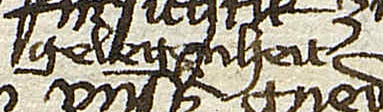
gelegenheit
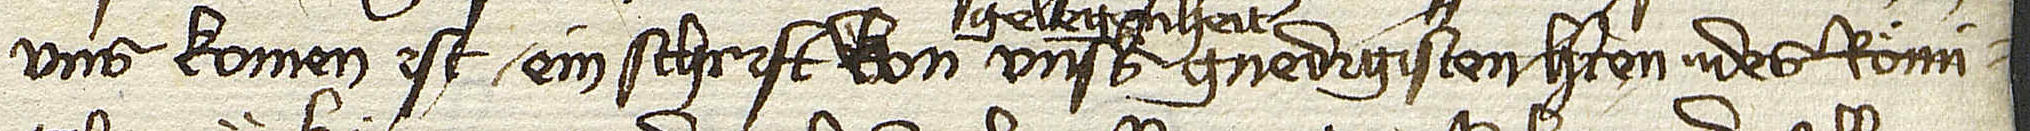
vns komen iſt / ein ſchrift Von vnſ*s gnedigiſten h*ren ~des Römi =
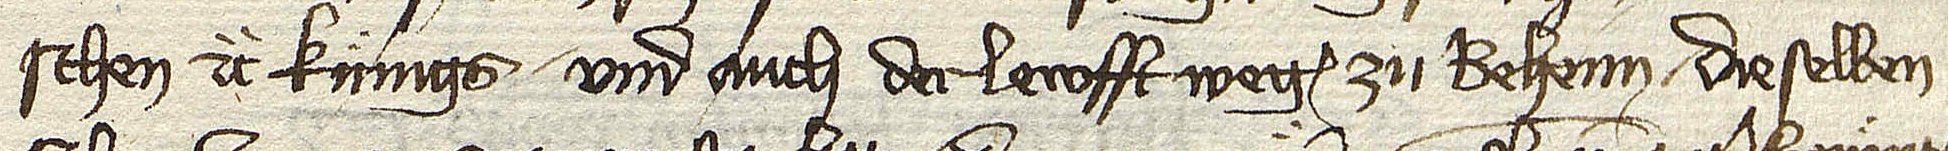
ſchen ec* künigs / vnd auch der lewfft weg* ʒu Beheim / dieſelben
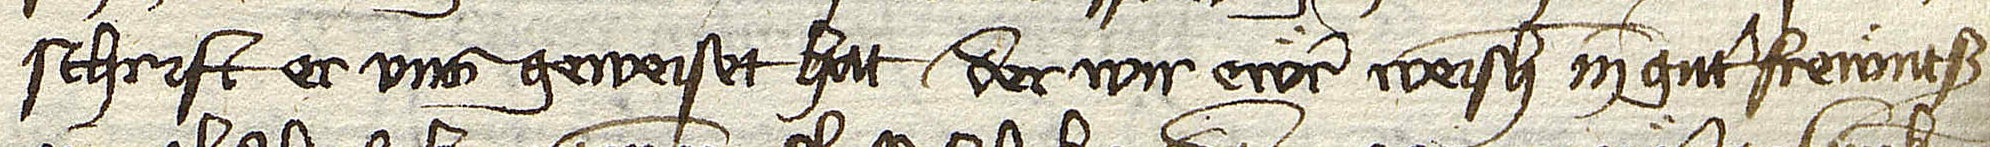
ſchrift er vns geweiſet hat / der wir ew*r weiſh* in gut* frewntſ*
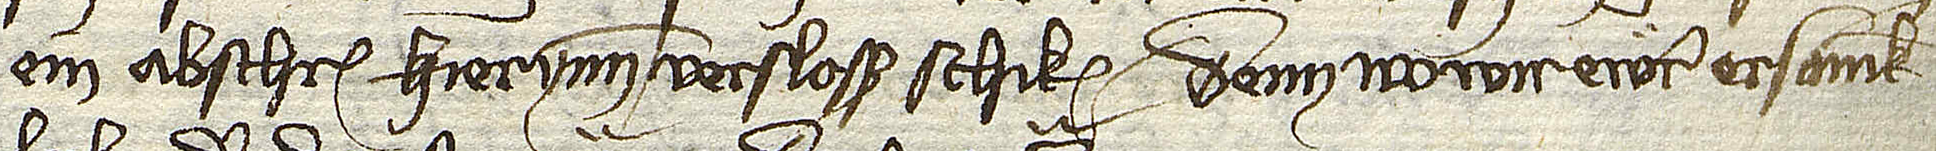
ein abſchr* hierynn* verſloſſ* ſchik* / Denn wo wir ew*r erſamk*
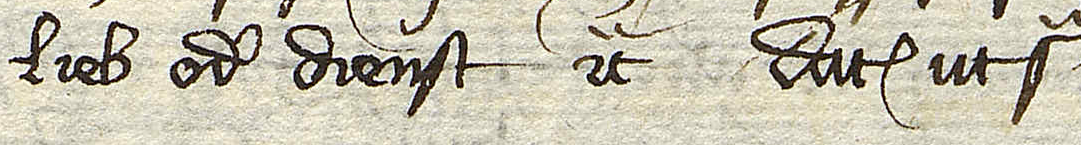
lieb od* dienſt ec* Dat* ut ſ*
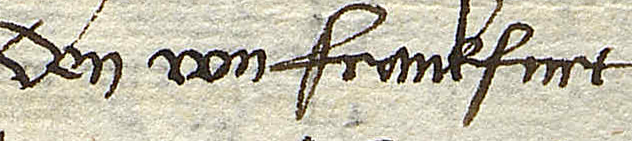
Den von Frankfurt
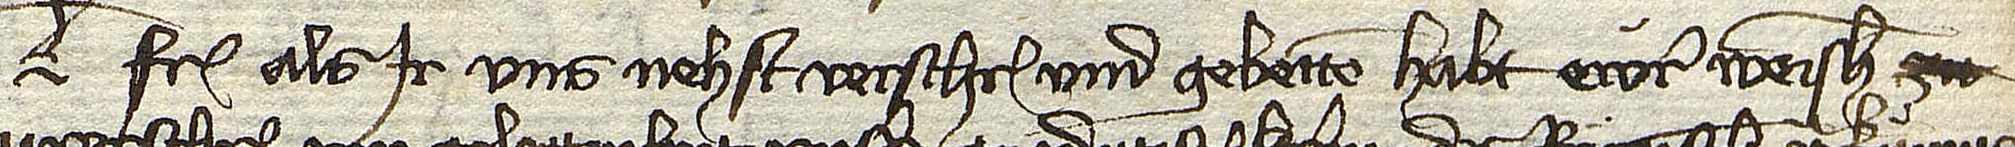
L* fr* als Ir vns nehſt verſchr* vnd gebette* habt ew*r weiſh* ʒu
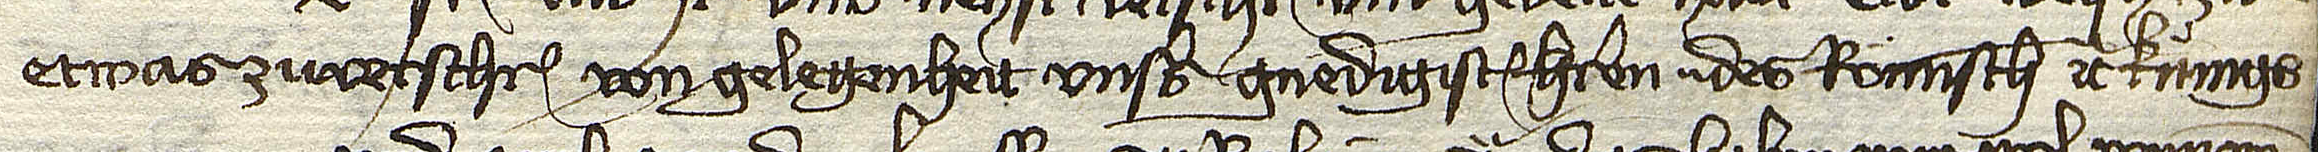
etwas ʒuverſchr* von gelegenheit vnſ*s gnedigiſt* h*ren ~des Römiſch* ec* künigs
